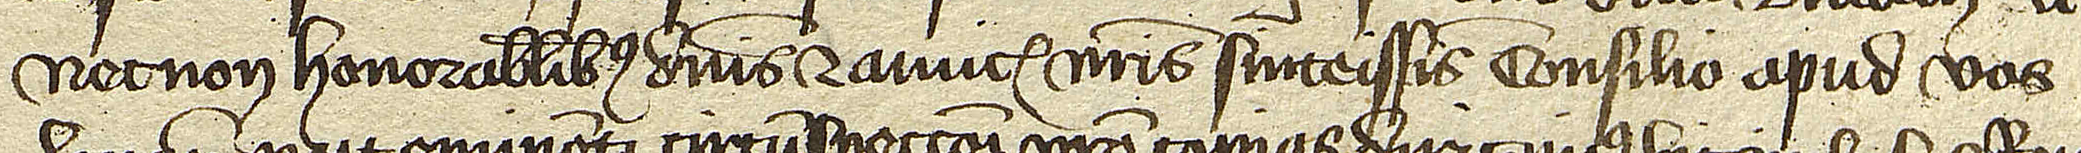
necnon honorab*lib* d*nis * amic* n*ris ſince*iſſi*s Conſilio apud vos
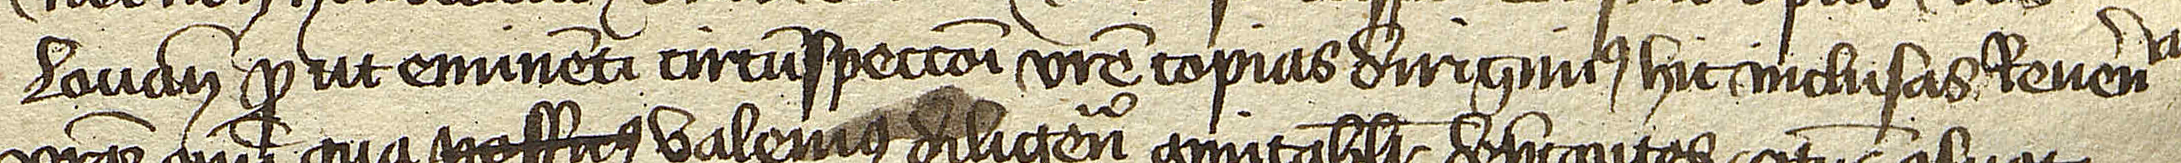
Louan* p*ut emine*ti circu*ſpecta* v*re copias dirigim* hic incluſas Reue*n*
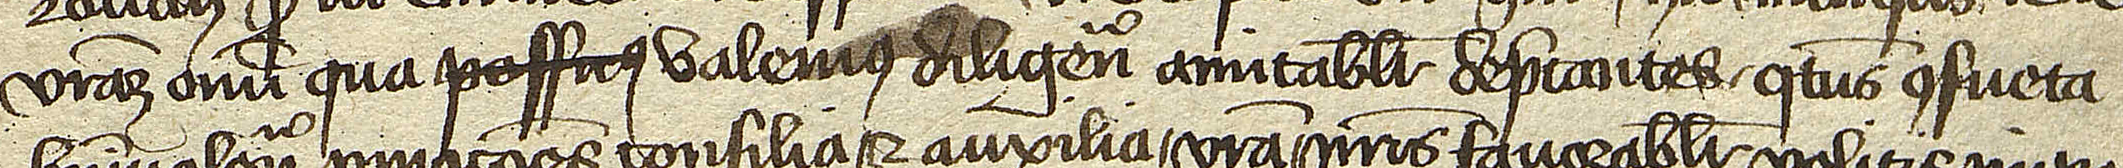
v*ra* om*i qua poſſa* valem* diligen* amicab*l*r dep*cantes / q*t*us *ſueta
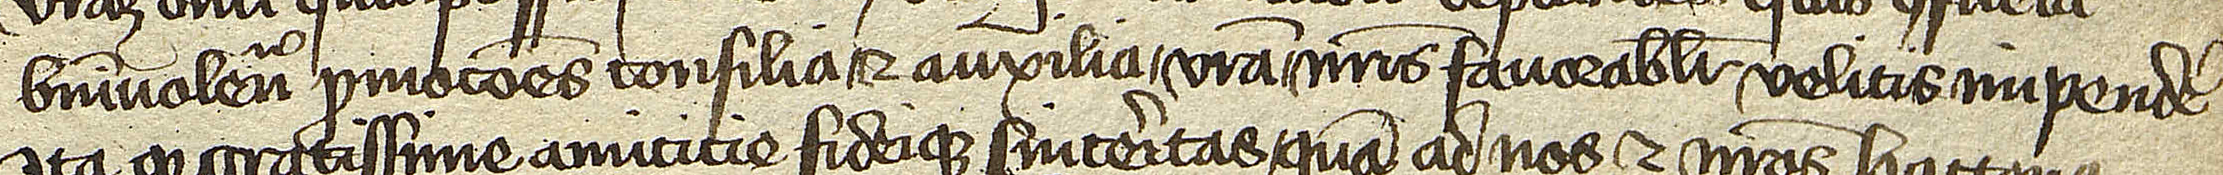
b*niuolen* p*mot*o*es conſilia @ auxilia / v*ra n*ras fauorab*l*r velitis impende*
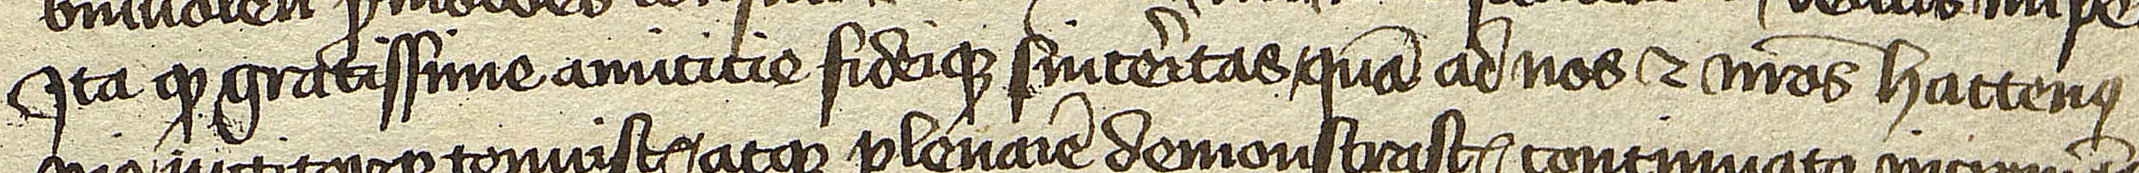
Ita q* graciſſime amicicie fideiq* ſincer*tas / qua* ad nos @ n*ros hacten*
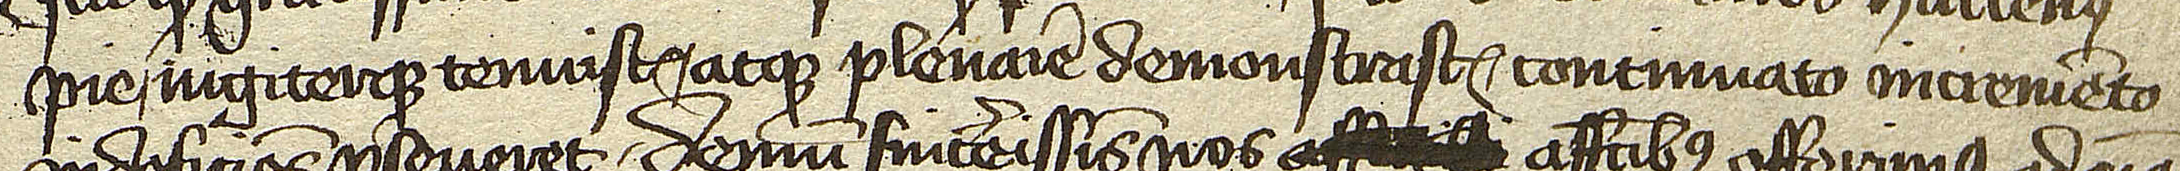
pie iugiterq* tenuiſt* atq* plena**e demonſtraſt* / continuato increme*to
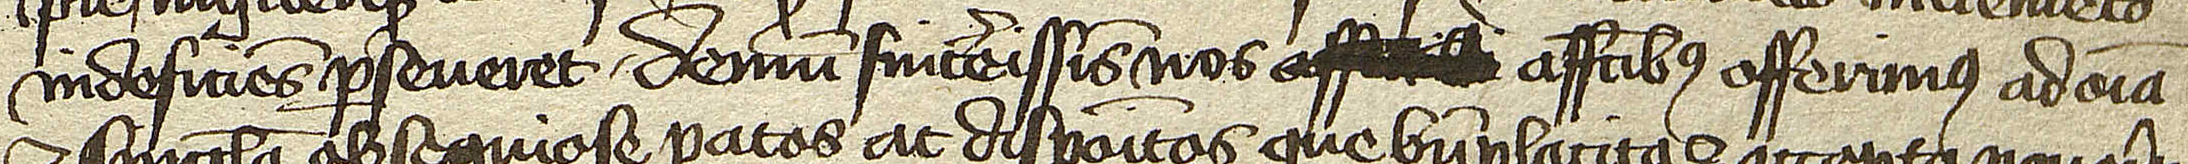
indeficie*s p*ſeueret / Demu* ſince*iſſ*is nos aff%%%% aff*tib* offerim* ad o*ia
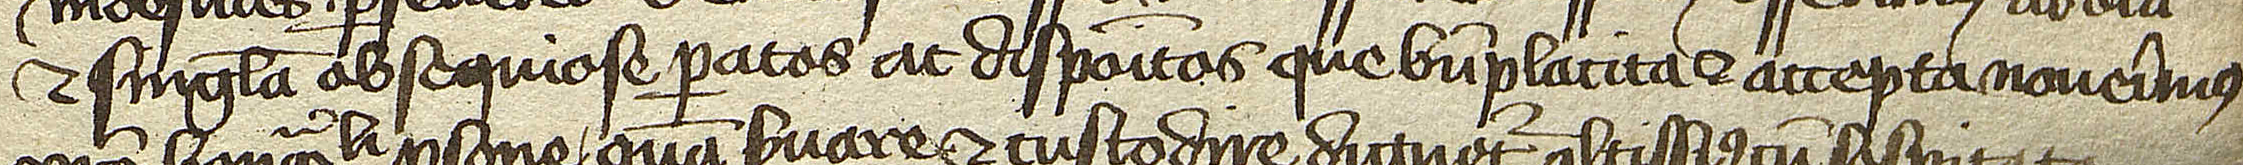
@ ſing*la obſequioſe p*atos ac diſpo*itas que b*n* placita @ accepta noue*im*
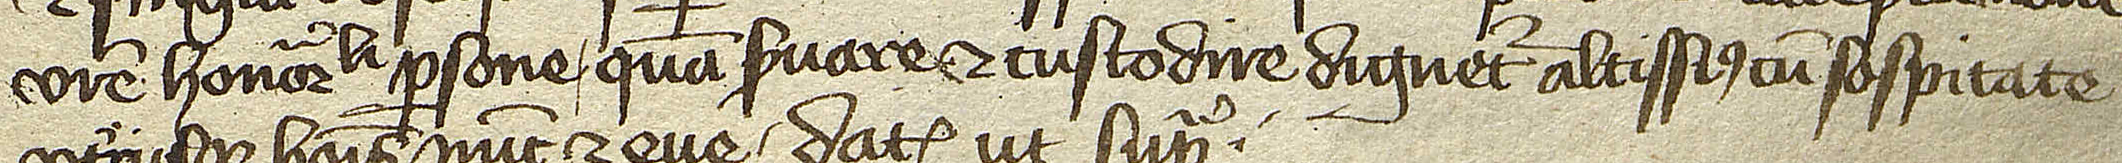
v*re honor*li p*ſone qua* ſ*uare @ cuſtodire dignet* altiſſi* cu* ſoſpitate
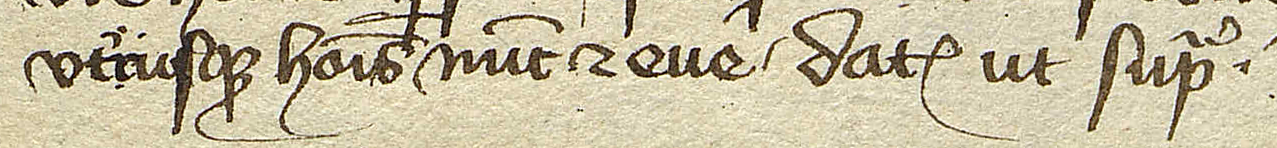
vtr*uſq* hois* nu*c @ eue / Dat* ut ſup* /
